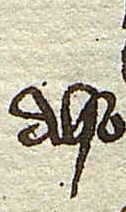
Alſo
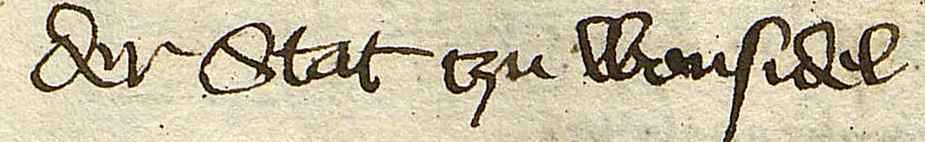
Der Stat cʒu Wonſidel
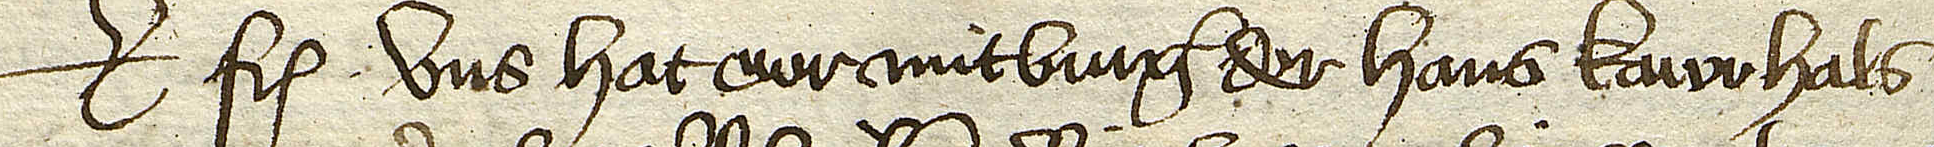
L* fr* . Vns hat ewr mitburg* der hans kawrhals
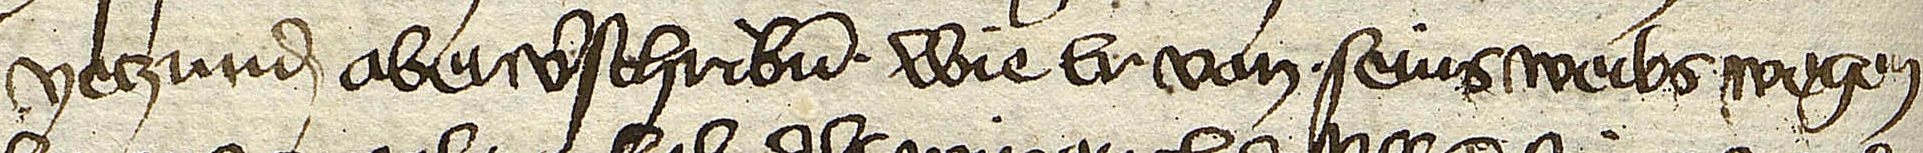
yecʒund* aber v*ſchrib*n . wie Er von . ſeins weibs wegen
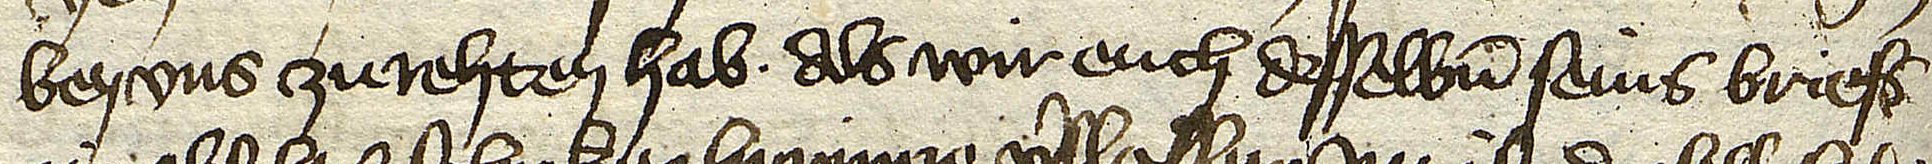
bey vns ʒu rehten hab . Als wir euch deſſelb*n ſeins briefs
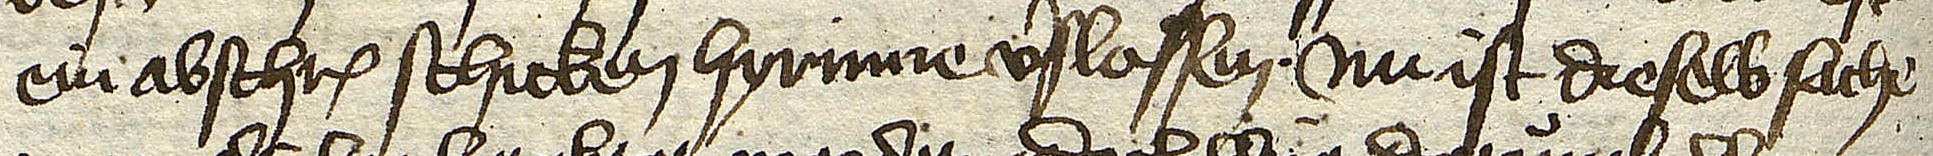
ein abſchr* ſchicken hyrinne vſ*loſſen . Nu iſt dieſelb ſache
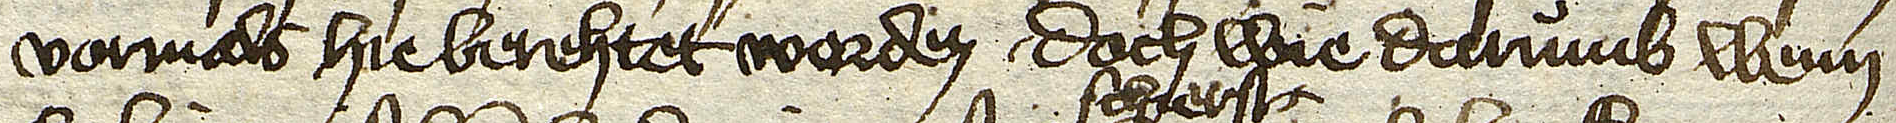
vormals hie berehtet worde* . doch wie darümb wenn
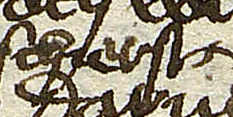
ſchierſt
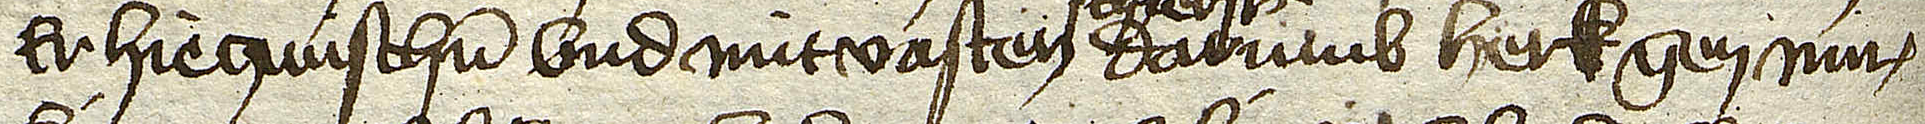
Er hiecʒwiſch*n vnd mitvaſten darümb herk gen nur*
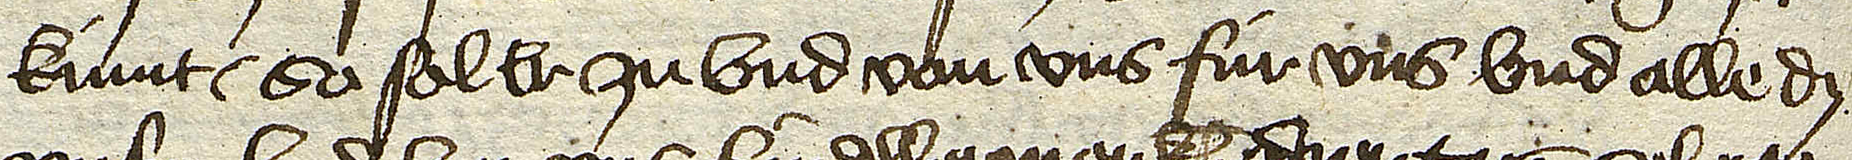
kümt / So ſol Er cʒu vnd von vns für vns vnd alle dy
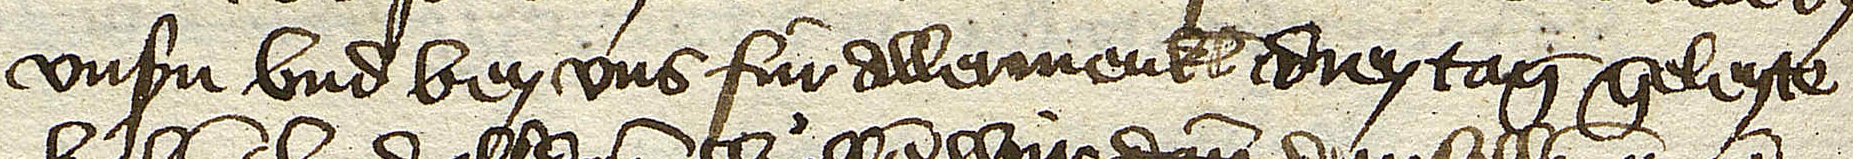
vnſ*n vnd bey vns für Allermenkl* / drey tag geleyte
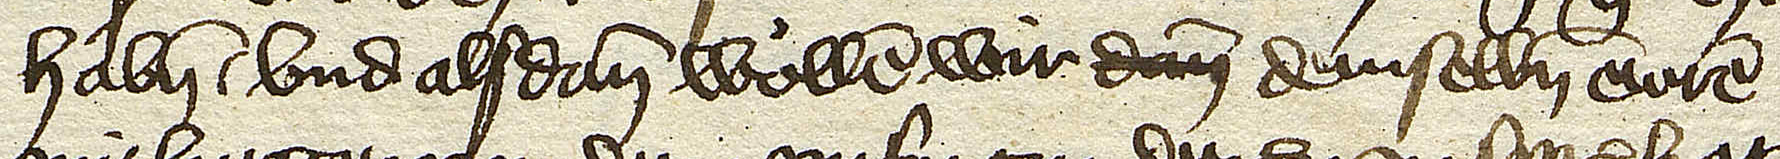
habn* / Vnd alſdan* wölle* wir dan* demſelb*n ewre*
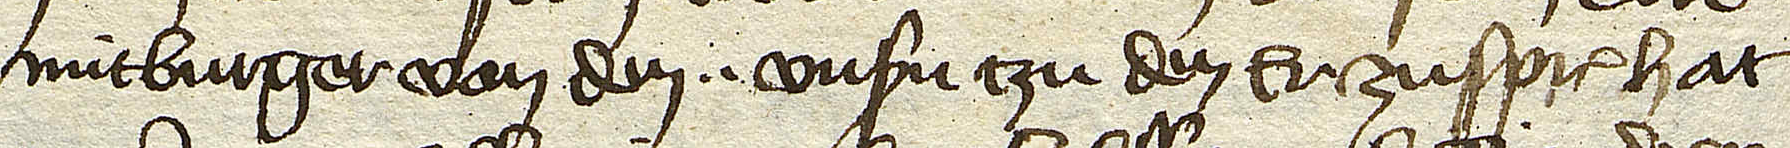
mitburger von dem . vnſ*n cʒu dem Er ʒuſpr* hat
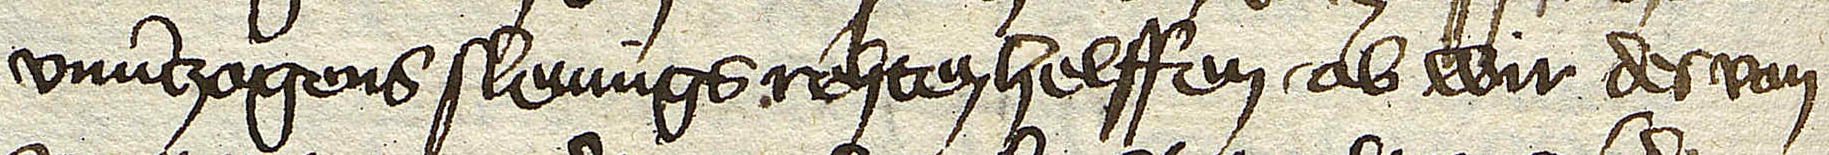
vnu*cʒogens ſleunigs rehte* helffen / ob wir des von
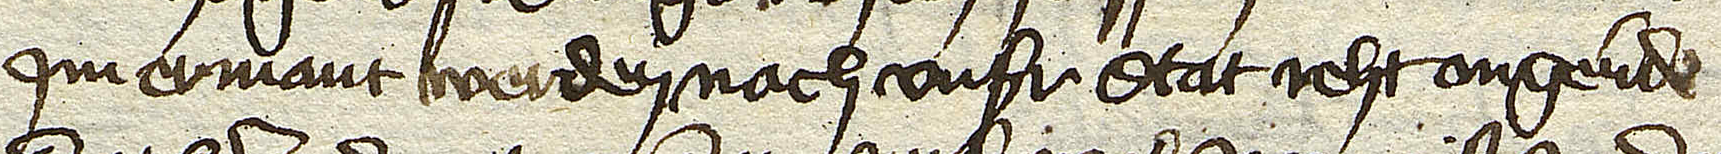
Im ermant werden nach vnſ*r Stat reht ongeu*de
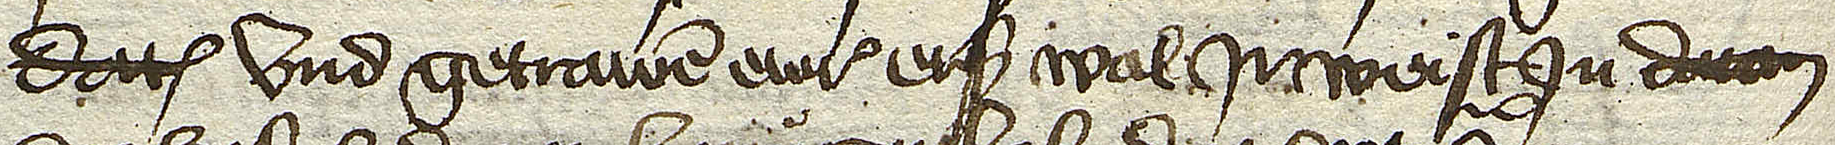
Dat* Vnd getrawe* ewr* erſ* wol Ir weiſt In daran
